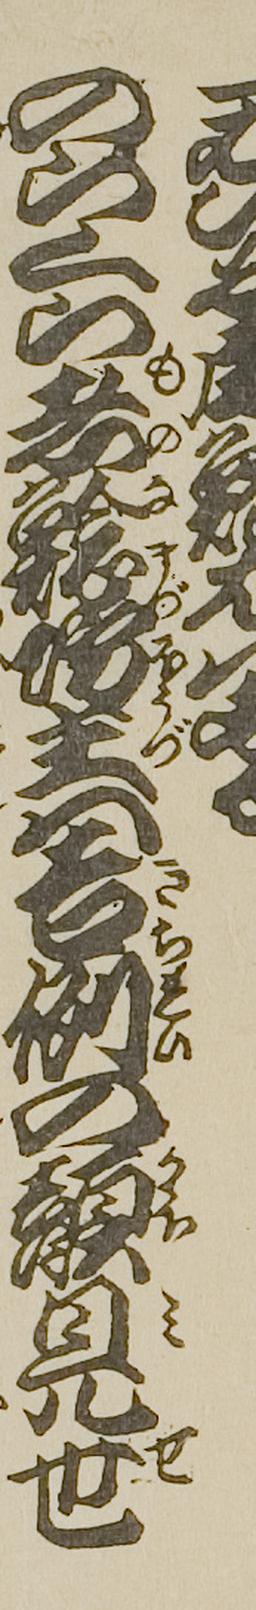のらくら者鯰坊主は吉例の顔見世
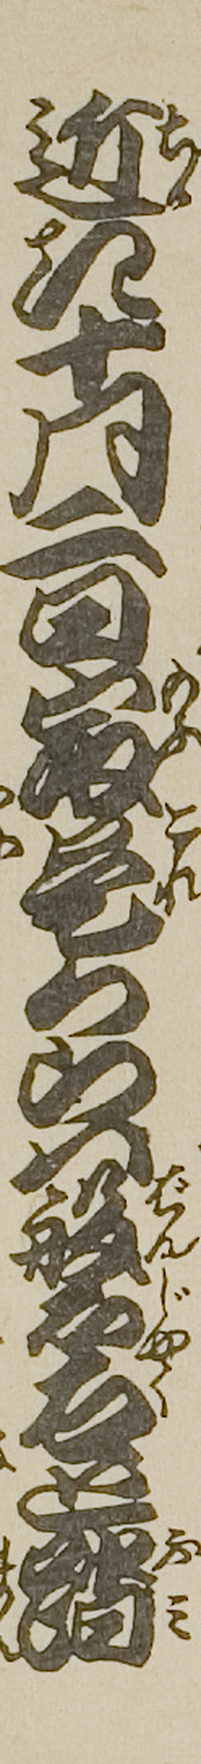近き十月二日最是からは磐石と踏
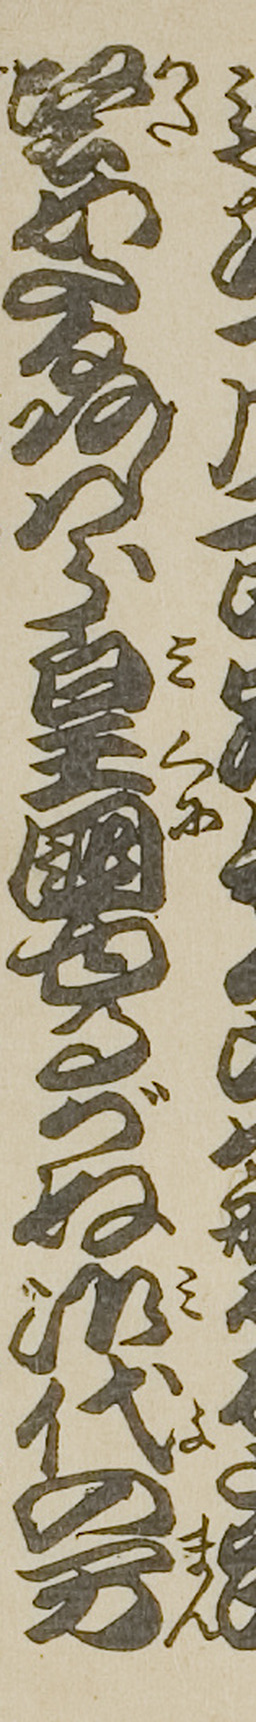堅めたるあしはら皇国ゆるがぬ御代の万
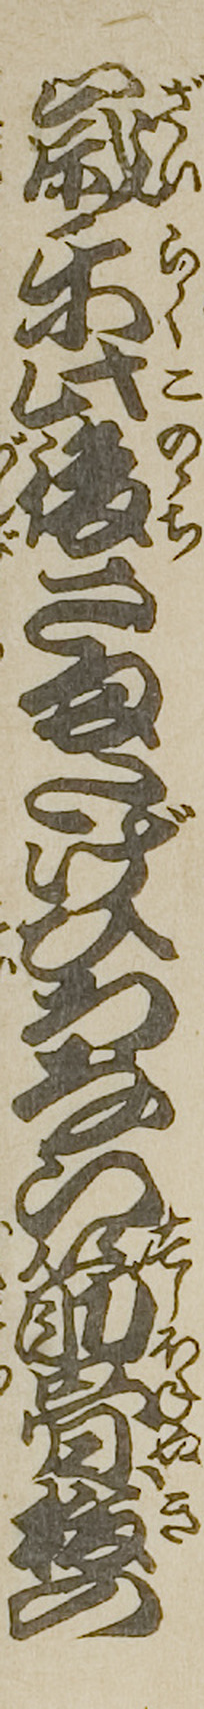歳楽此後さまたげひろない筋骨抜の
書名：聖代要石治万歳楽のつらね
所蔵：東京大学総合図書館 General Library in the University of Tokyo, JAPAN
